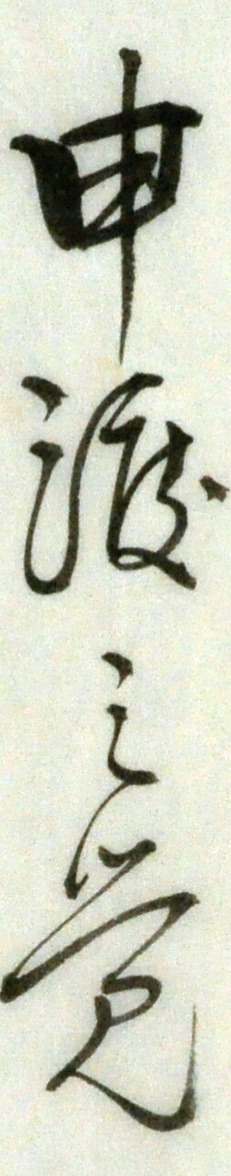申渡之覚

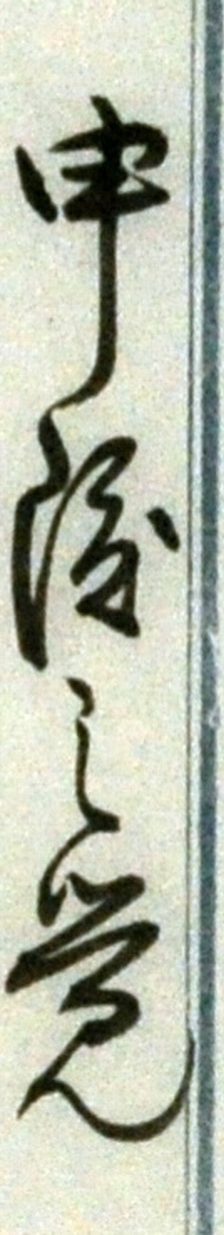申渡之覚
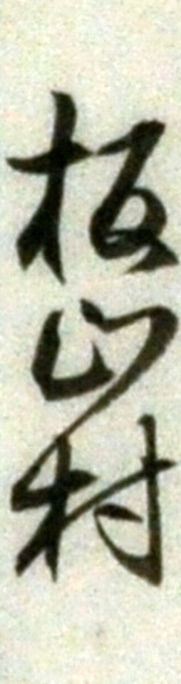板山村
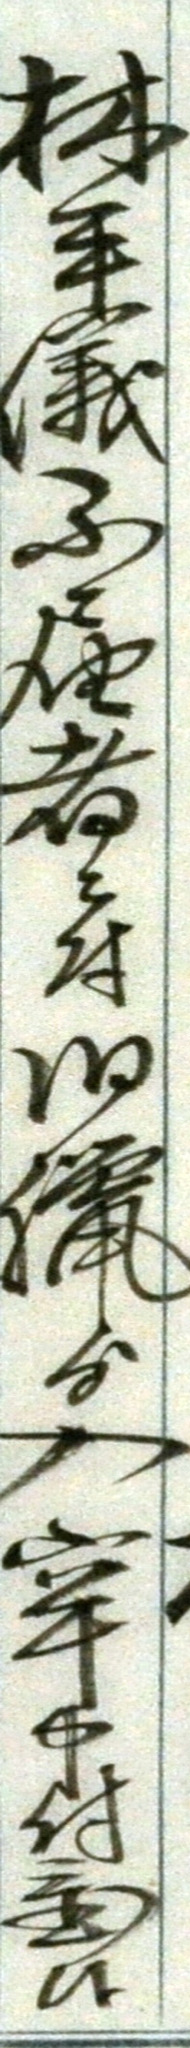林平儀不届者ニ付旧臘ゟ入牢申付置候
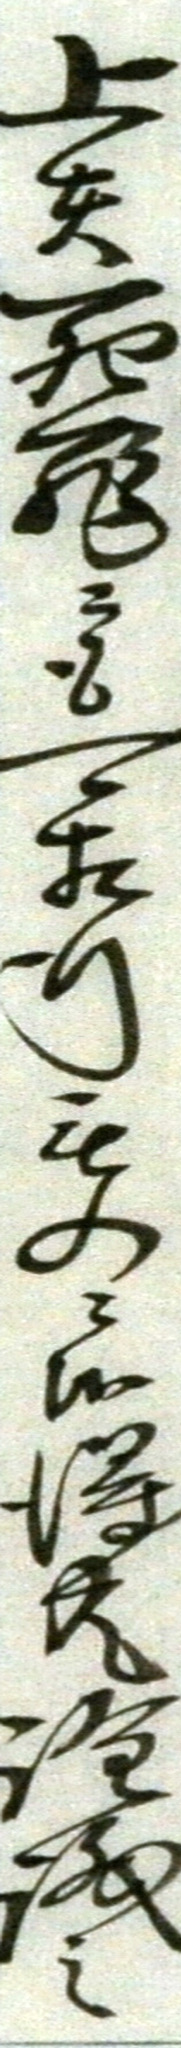上者死罪ニも可相行ものニ候得共詮議之
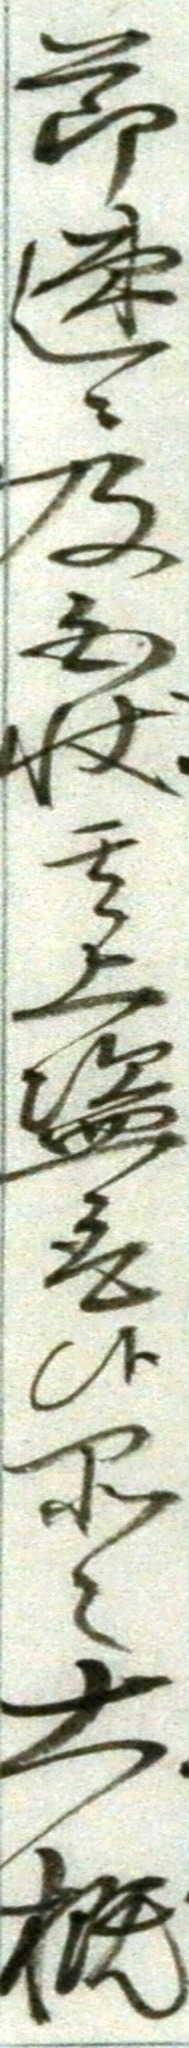節速ニ及白状其上盗取候品々大概
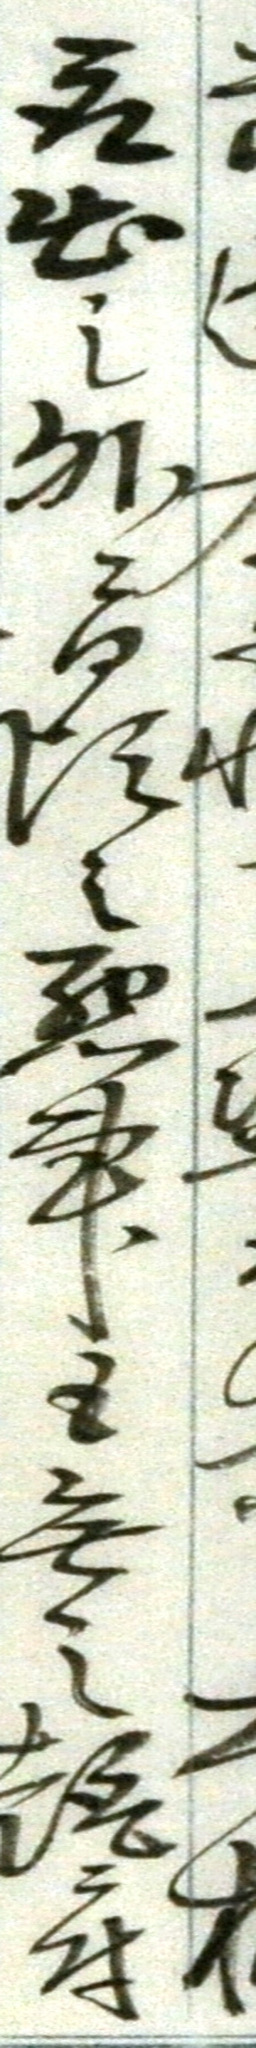取出し外ニ日頃之悪事も無之趣ニ付
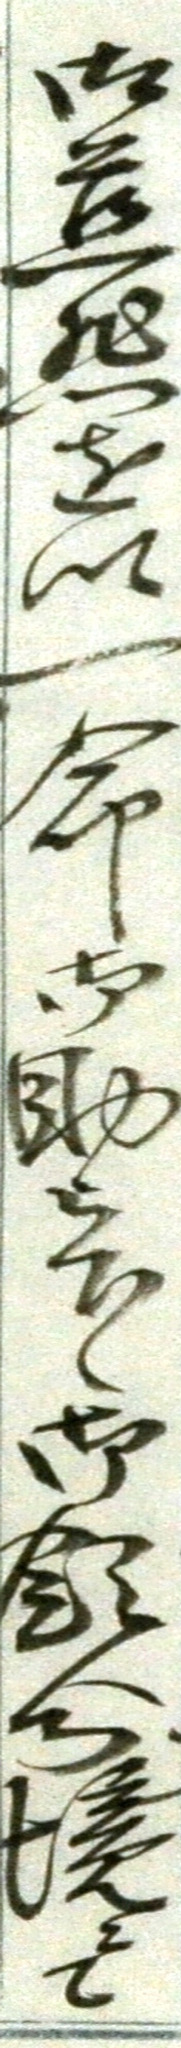御慈悲を以一命御助被下候御領分境ニて
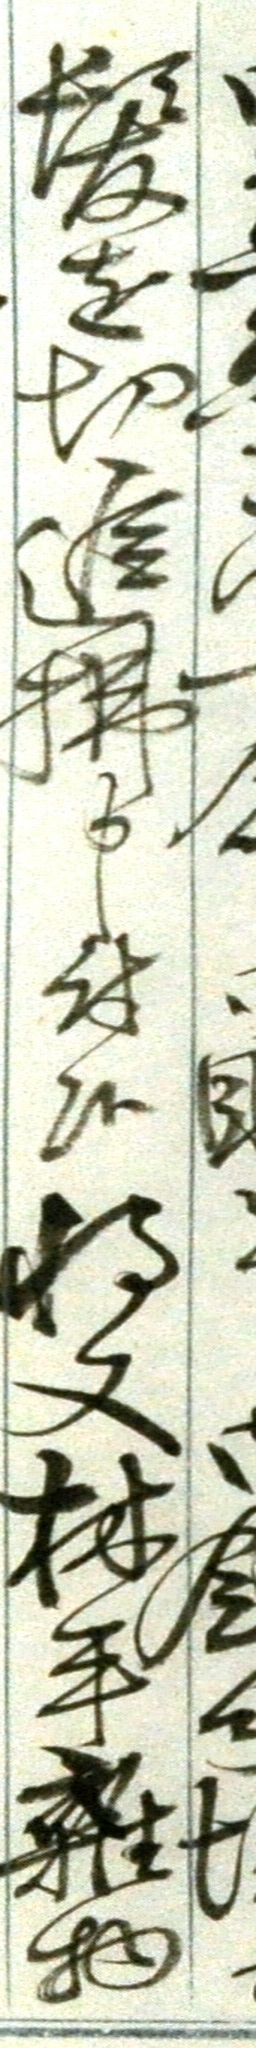髪を切追払申付候将又林平雑物
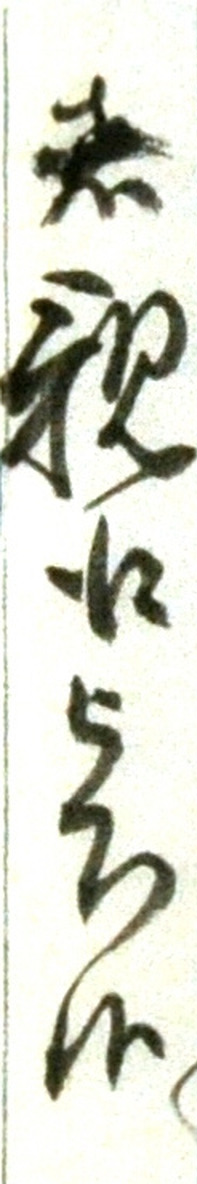者親取被下候

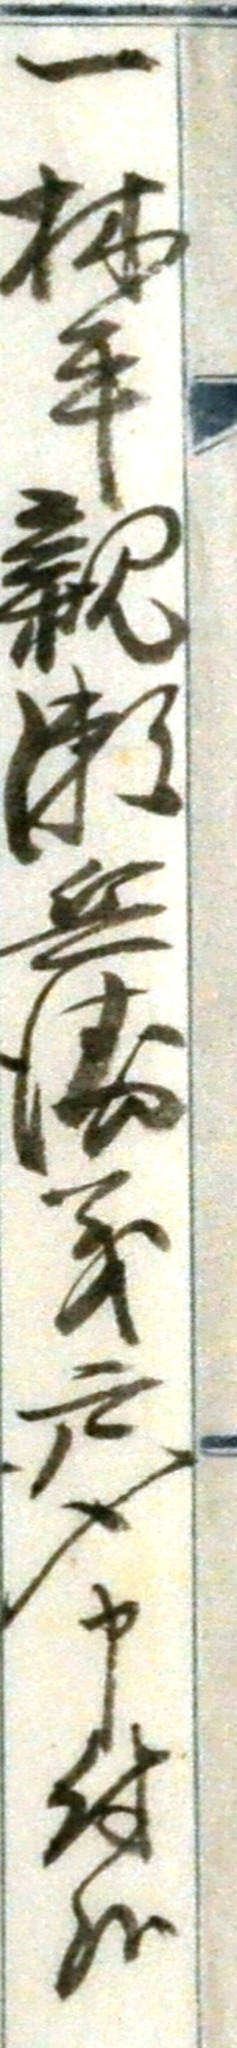一林平親瀬兵衛義戸〆申付候
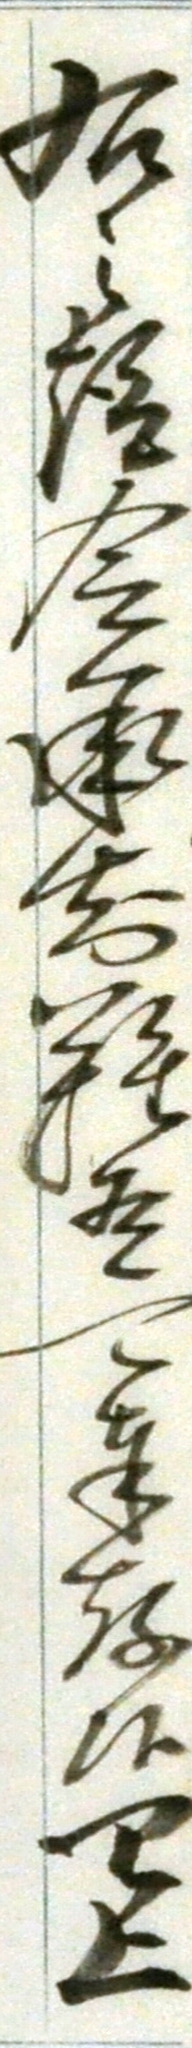右之趣令承知難有可奉存候已上
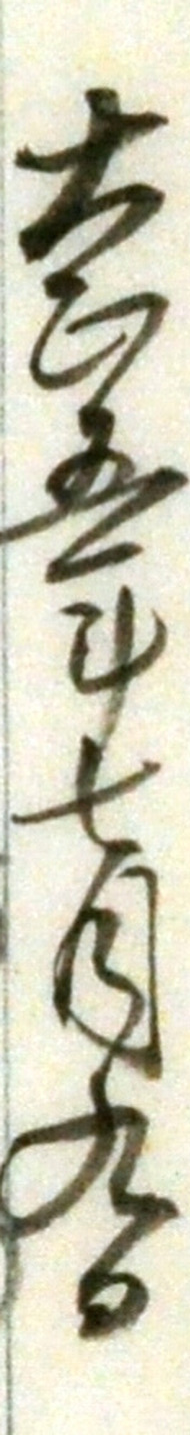大正五年七月九日
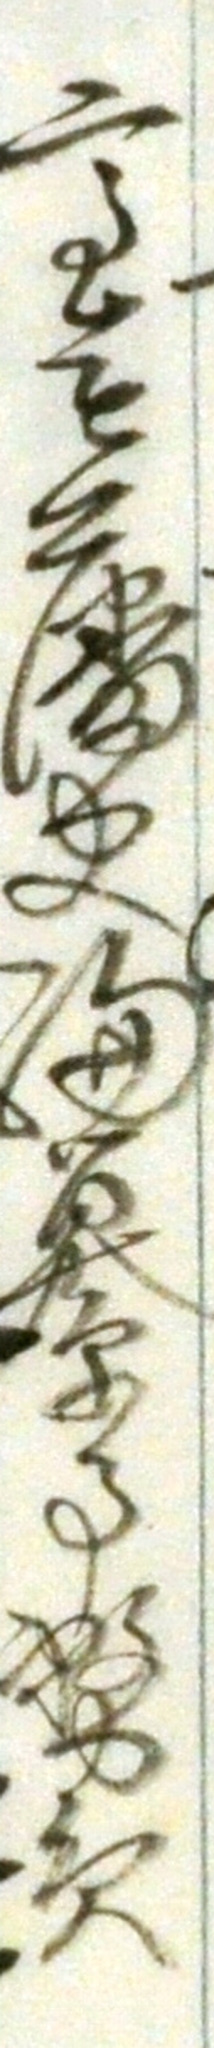高遠藩史編纂事務員
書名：申渡之覚
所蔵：伊那市立高遠町図書館・合同会社AMANE
